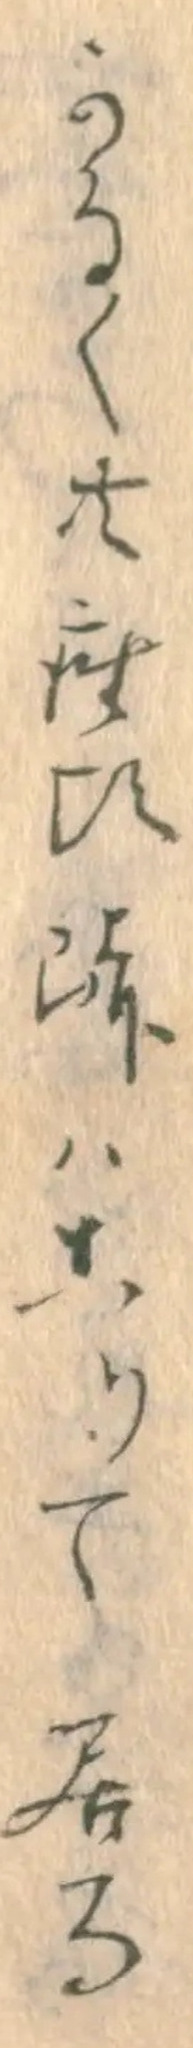かるく共座頭峠はこりて居る
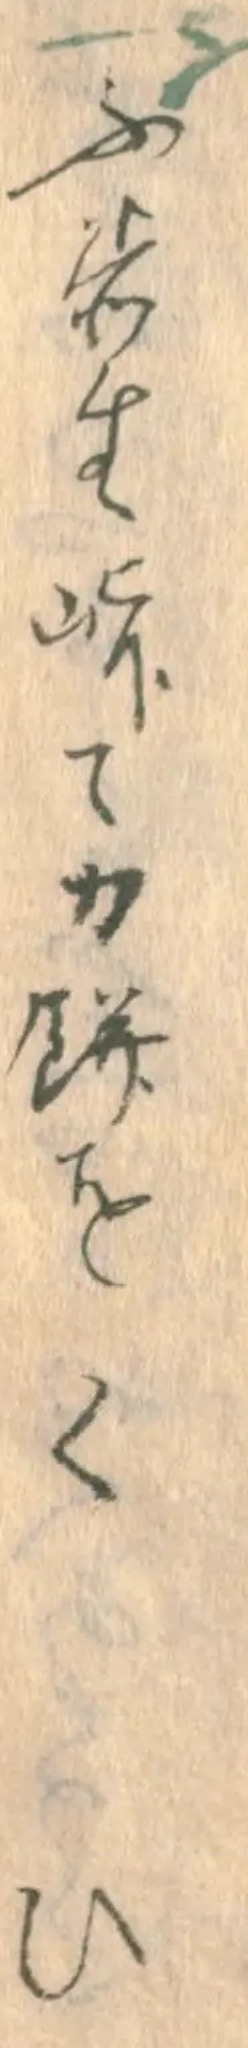不養生峠で力餅をくひ
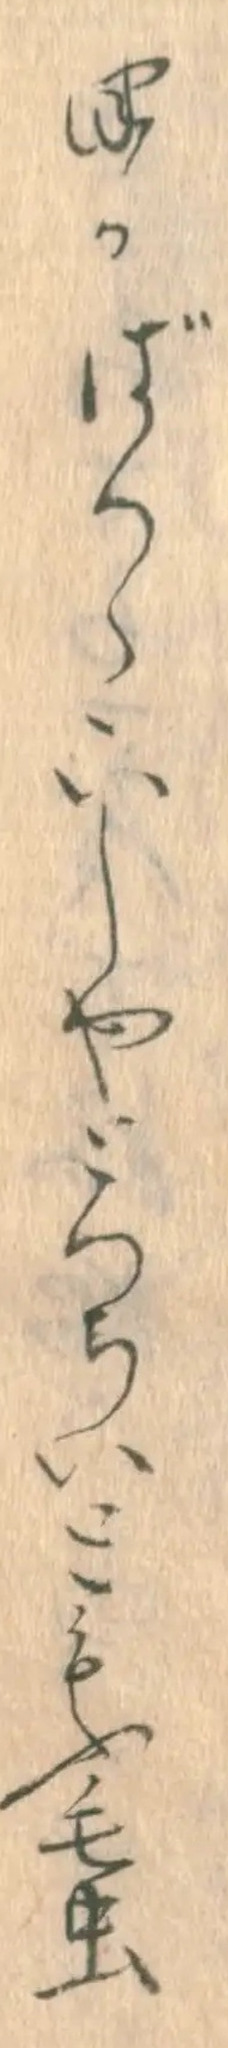つのばつたいしやとつりいともふ毛虫
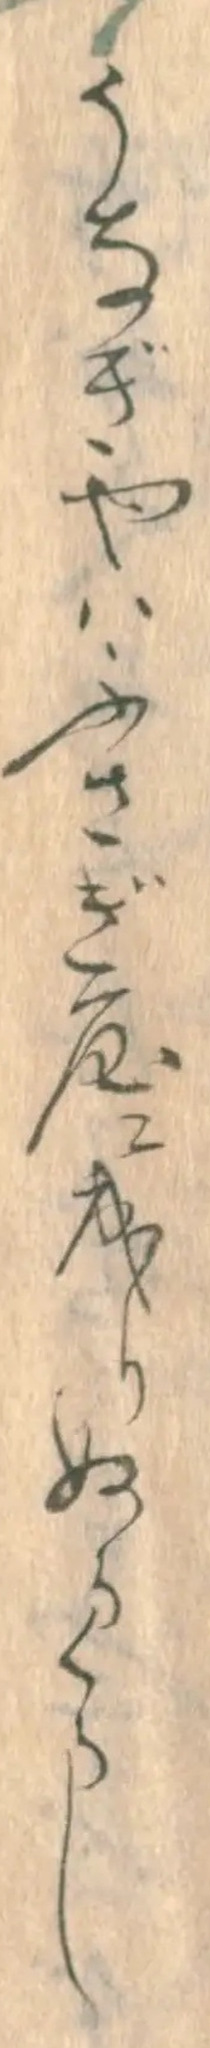うなぎやハふさぎ屋に成りぬらくらし
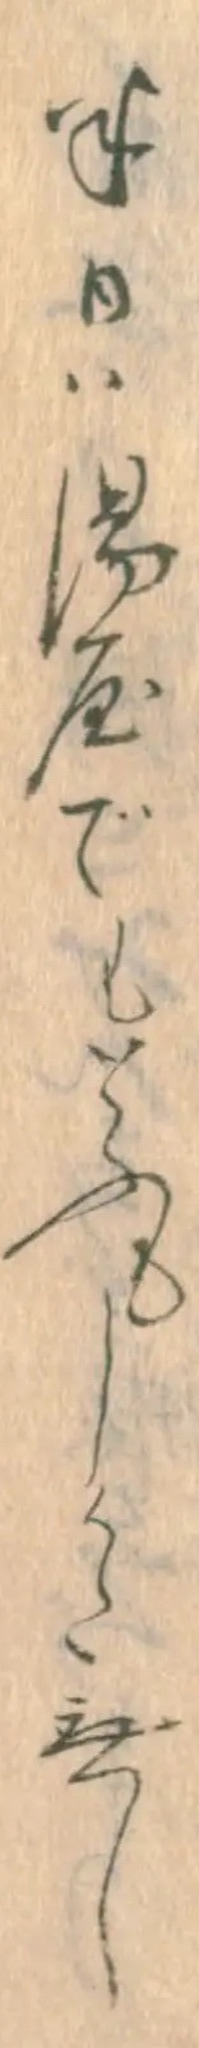半日は湯屋でもとふもしかた無し
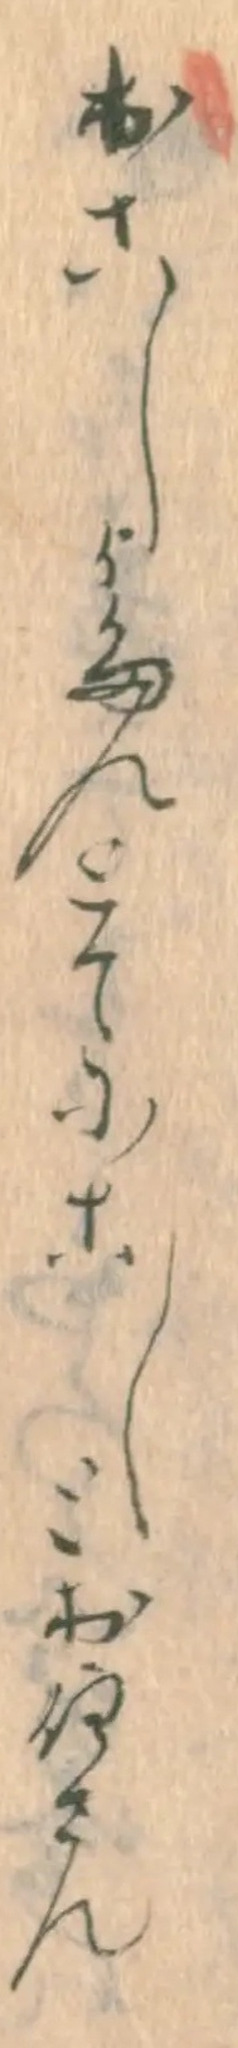おこしがたんとでにこにことお住さん
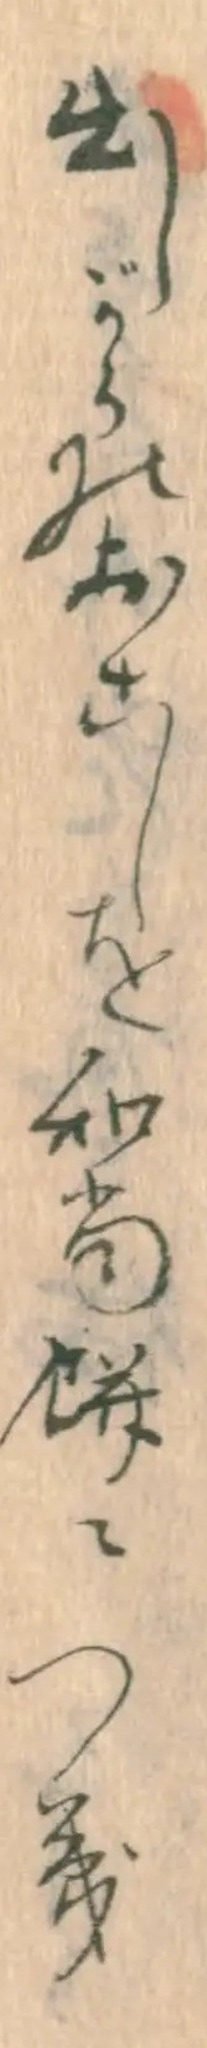出しがらのおこしを和尚餅につき
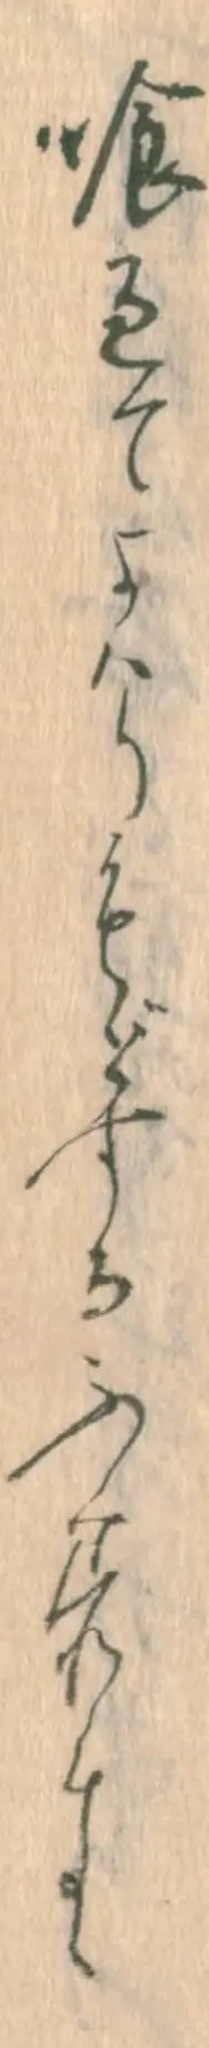喰過てよはりもぞする不養生
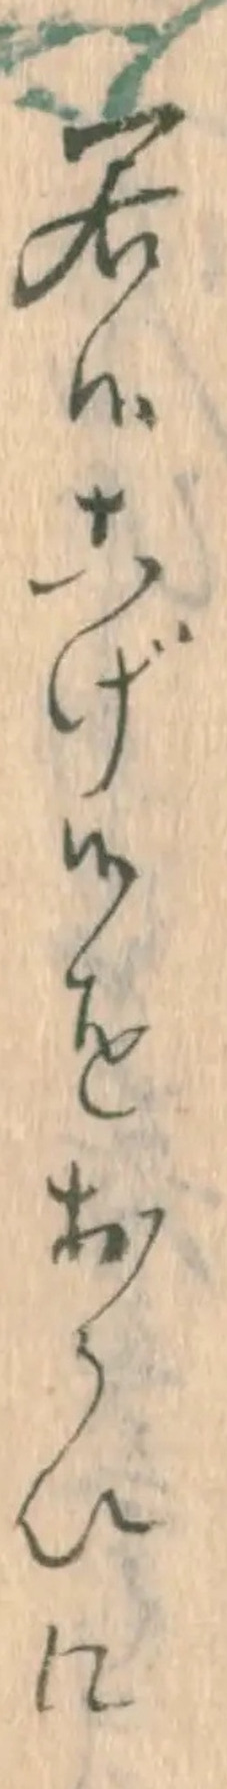居候こげ候をおかひにし
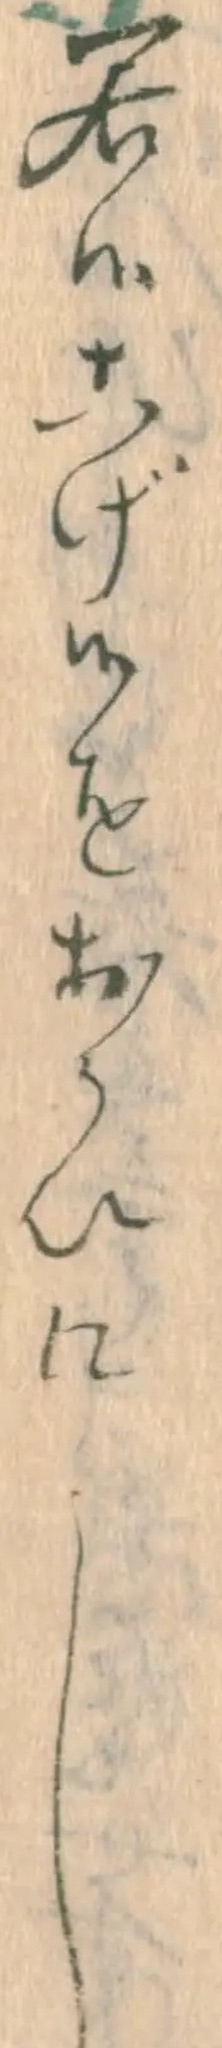居候こげ候をおかひにし
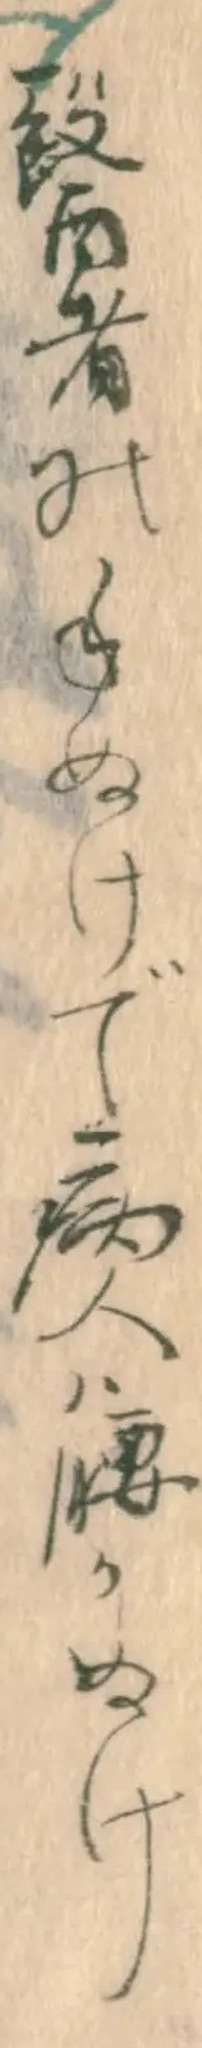医者の手ぬけで病人ハ腰かぬけ
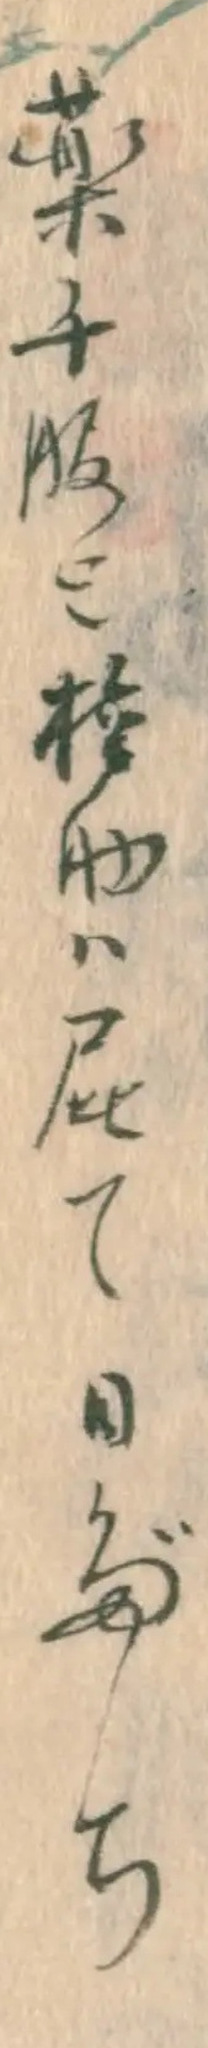薬千服と権助は屁て日だち
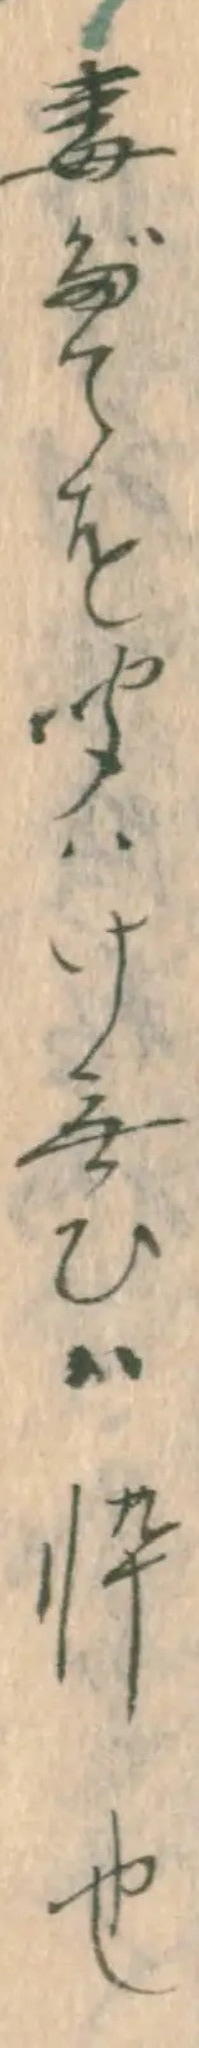毒だてを聞ハけ無ひハ伜なり
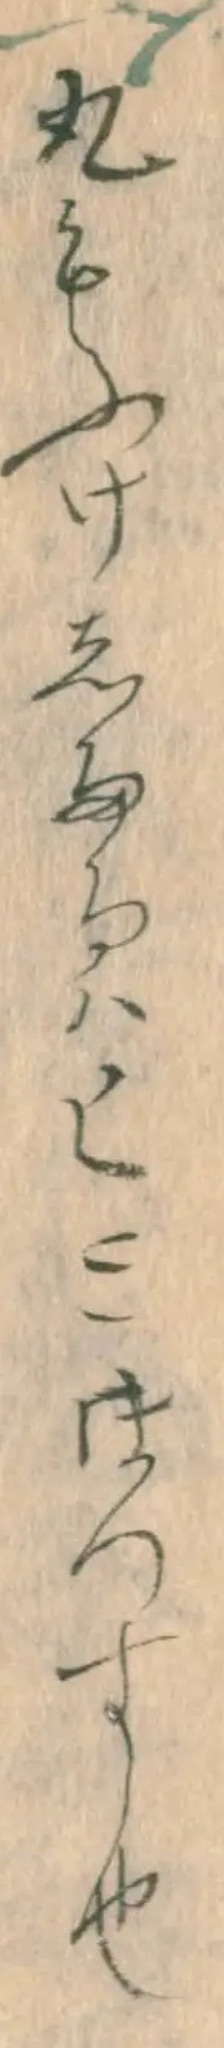丸もふけしたるは匕とほつす也
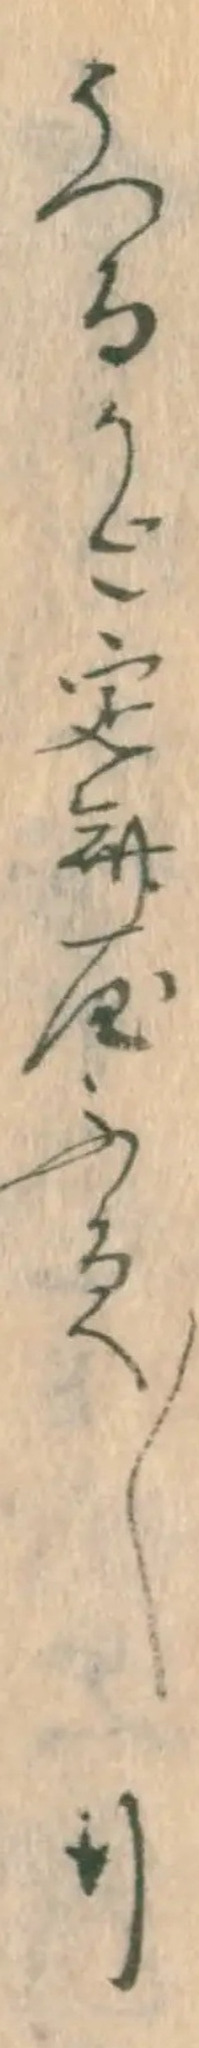うつるかと定斎屋ふるへふるへ行
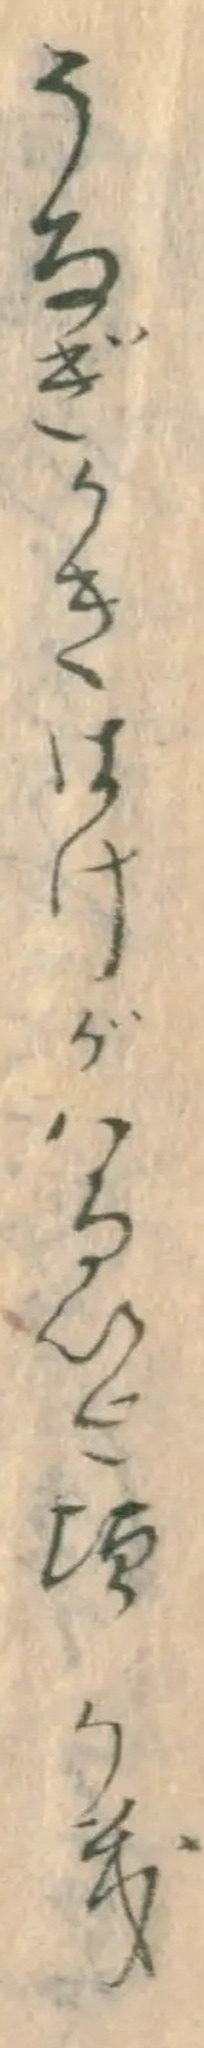うなぎかきはけがハるいと頭かき
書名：麻疹後柳樽
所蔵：国立国会図書館 National Diet Library, JAPAN
